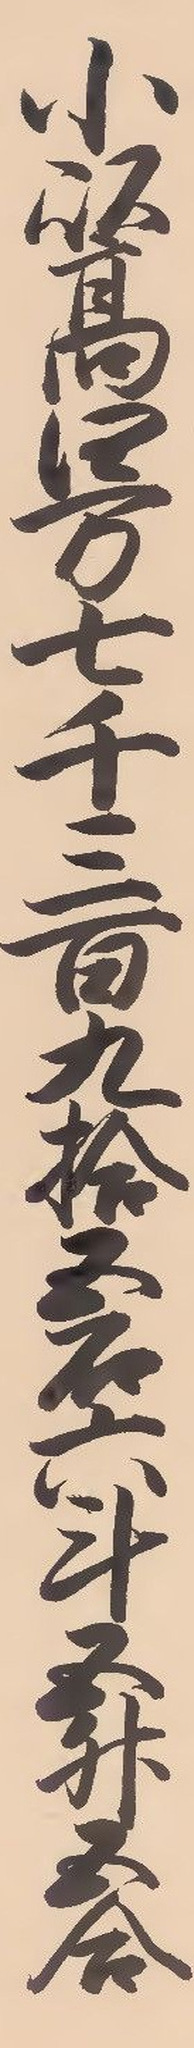小以髙四万七千三百九拾五石六斗五升五合

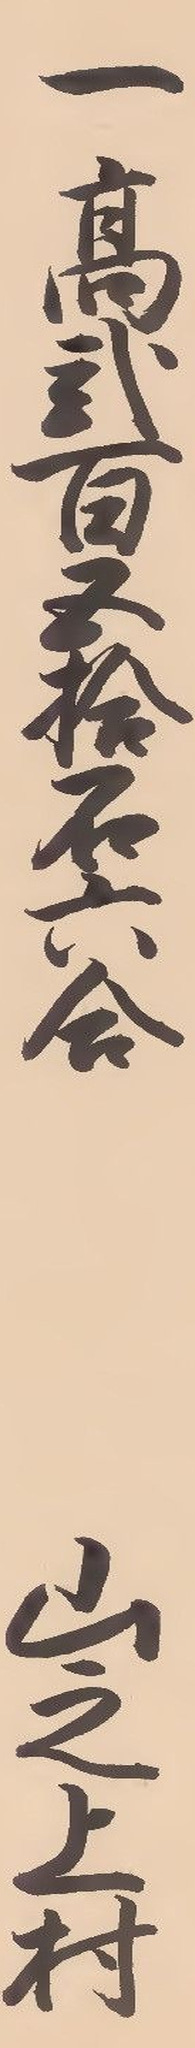一髙弐百五拾石六合山之上村
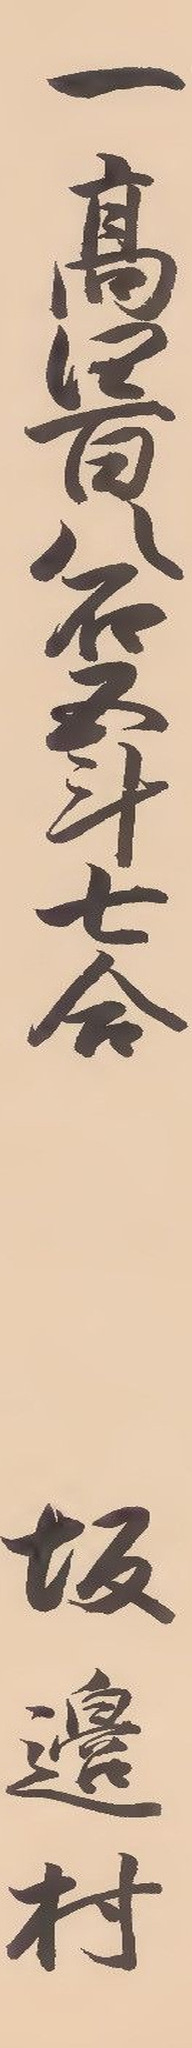一髙四百八石五斗七合坂邉村
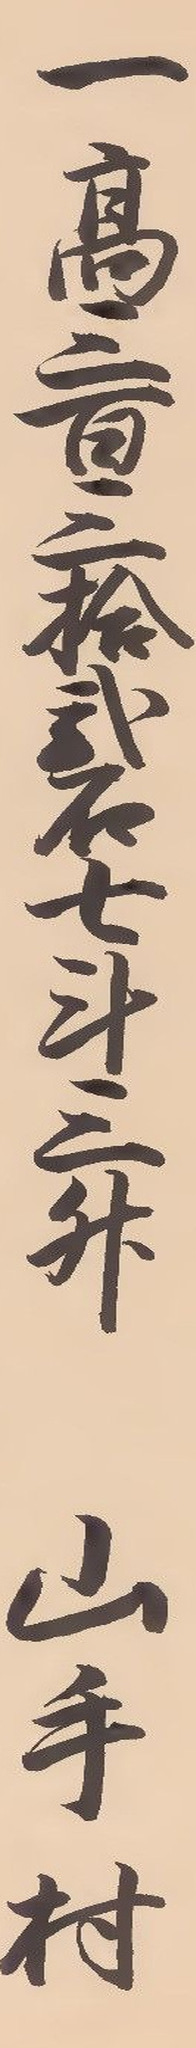一髙三百三拾弐石七斗三升山手村
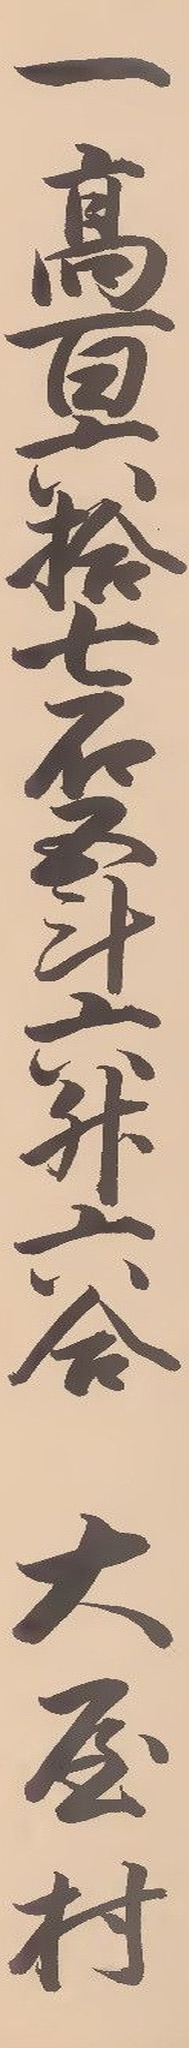一髙百六拾七石五斗六升六合大屋村
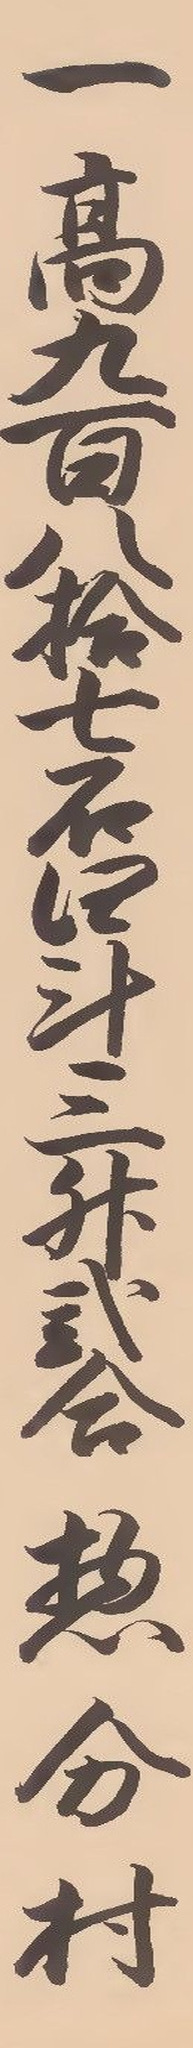一髙九百八拾七石四斗三升弐合惣分村
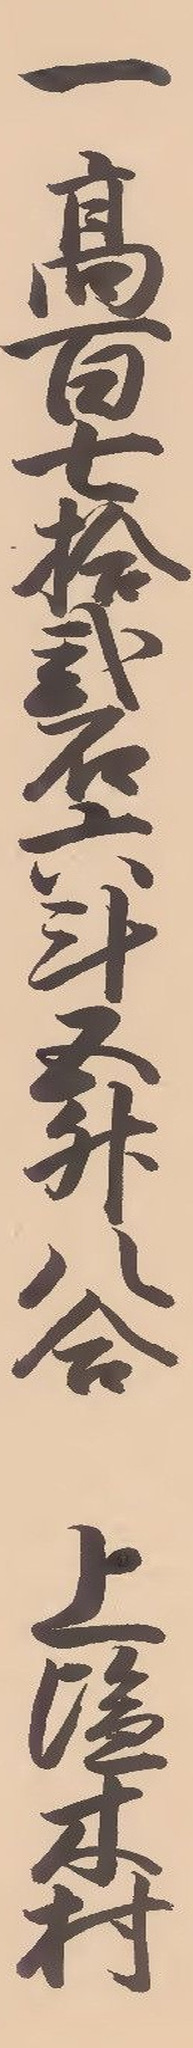一髙百七拾弐石六斗五升八合上塩木村
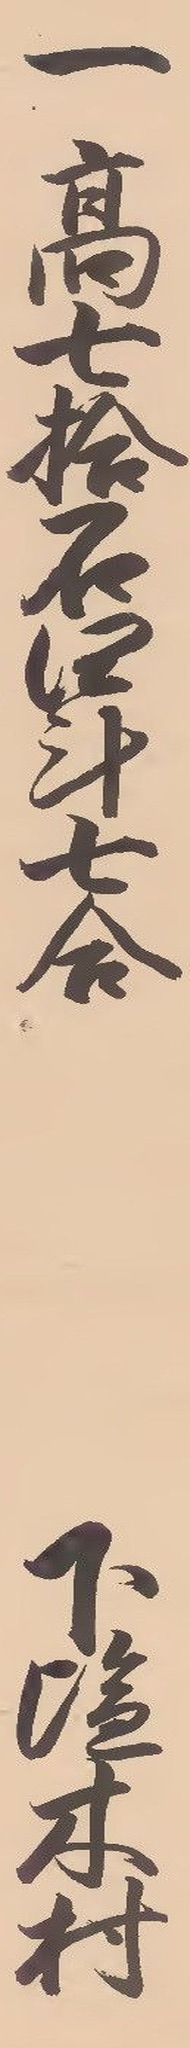一髙七拾石四斗七合下塩木村

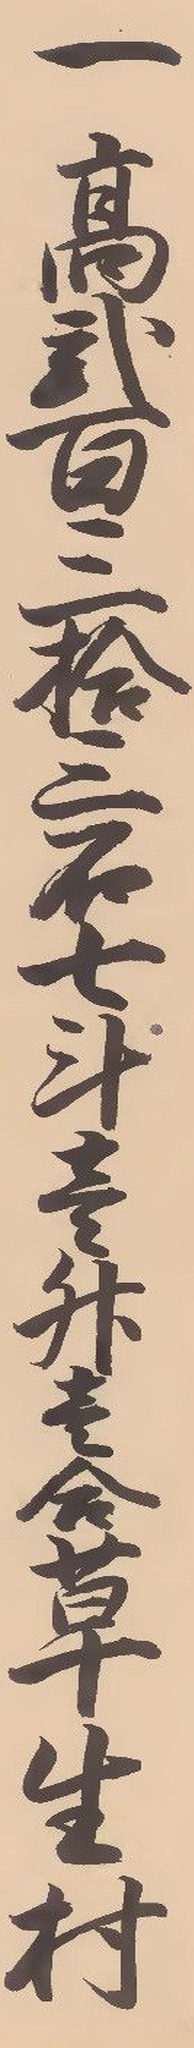一髙弐百三拾三石七斗壱升壱合草生村
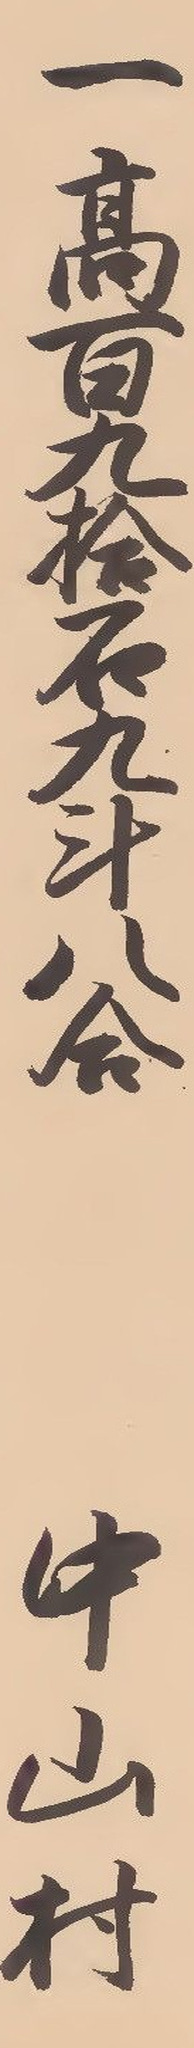一髙百九拾石九斗八合中山村
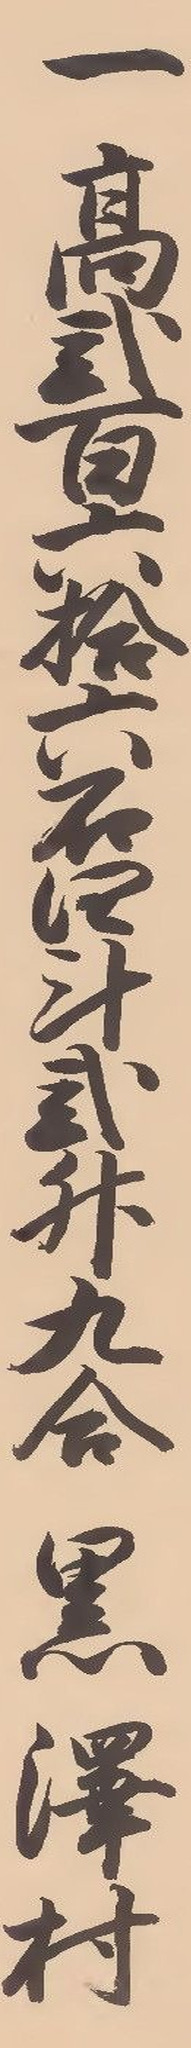一髙弐百六拾六石四斗弐升九合黑澤村
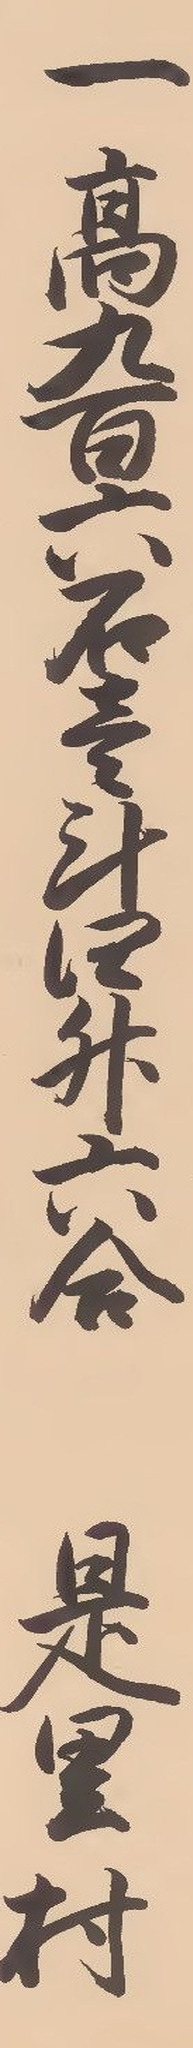一髙九百六石壱斗四升六合是里村
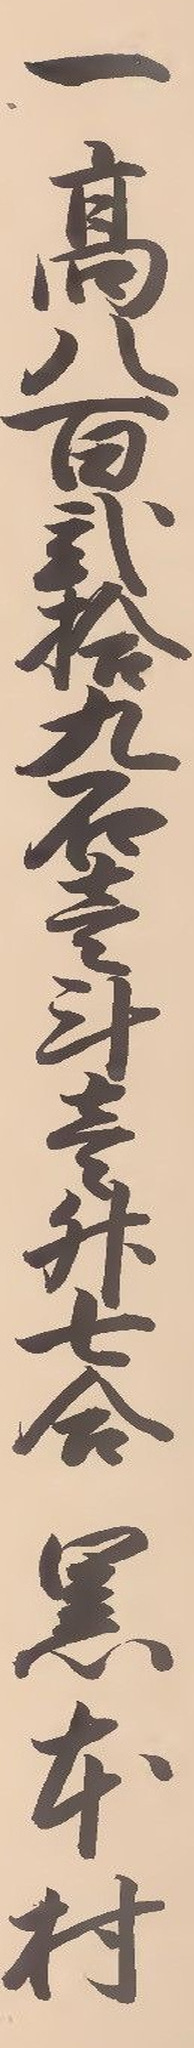一髙八百弐拾九石壱斗壱升七合黑本村
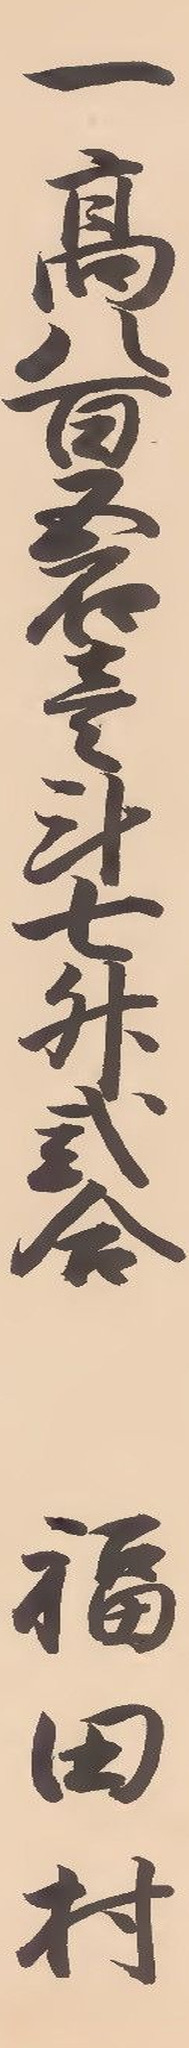一髙八百五石壱斗七升弐合福田村
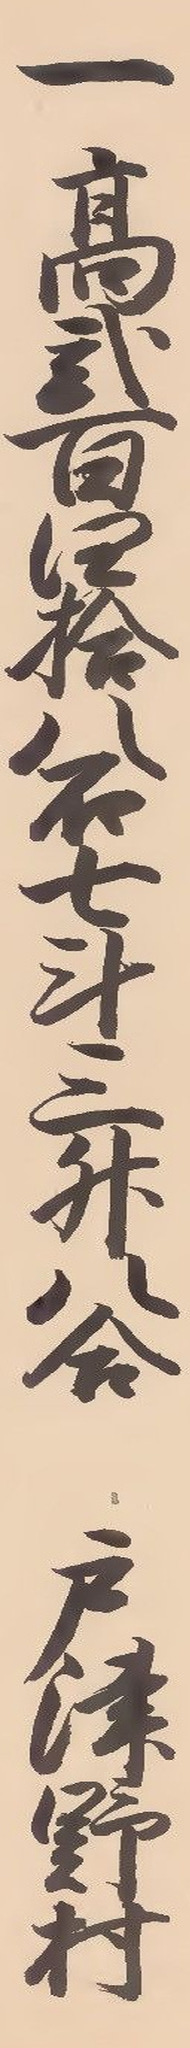一髙弐百四拾八石七斗三升八合戸津野村
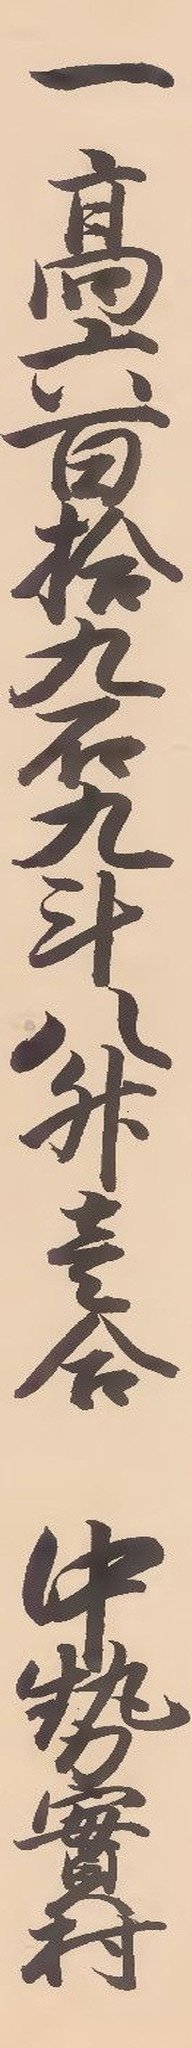一髙六百拾九石九斗八升壱合中勢實村
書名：備前国郷帳
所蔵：国立公文書館 National Archives of Japan
